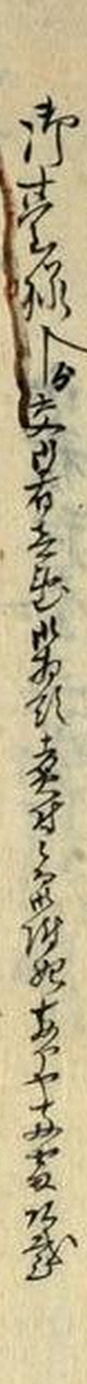御台様ゟ交御肴壱台御拝領煮付ニ而御附始両部や両番頂戴
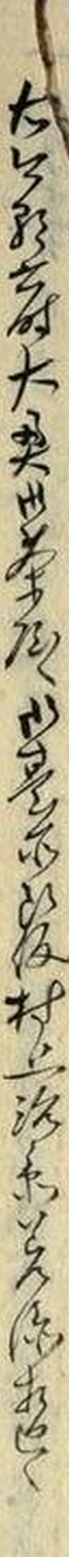右今朝六時大奥御茶屋へ御台所頭仮村上治兵衛差添相廻候
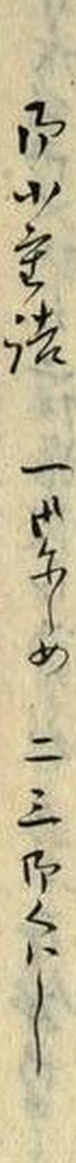御小重詰一御にしめ二三御くハし
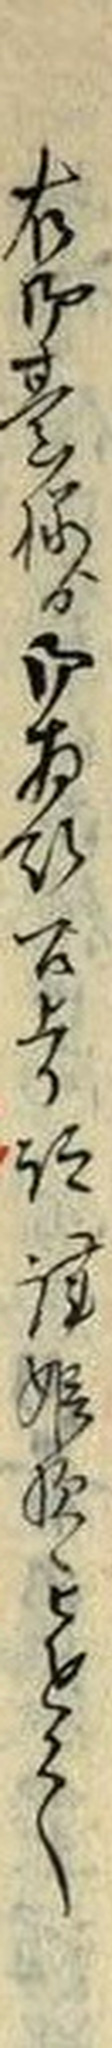右御台様ゟ御拝領召上り跡謹姫様へ被進之
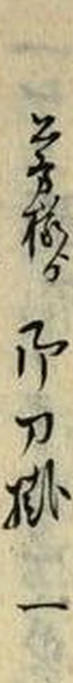公方様ゟ御刀掛一
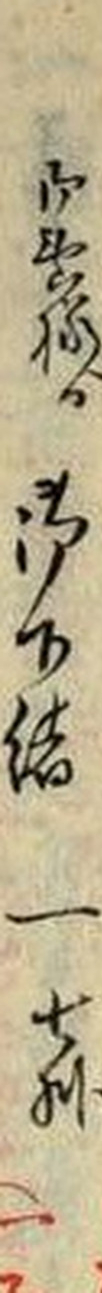御台様ゟ御下緒一七掛
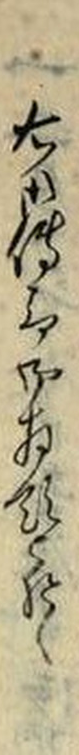右御伝ニ而御拝領被遊候

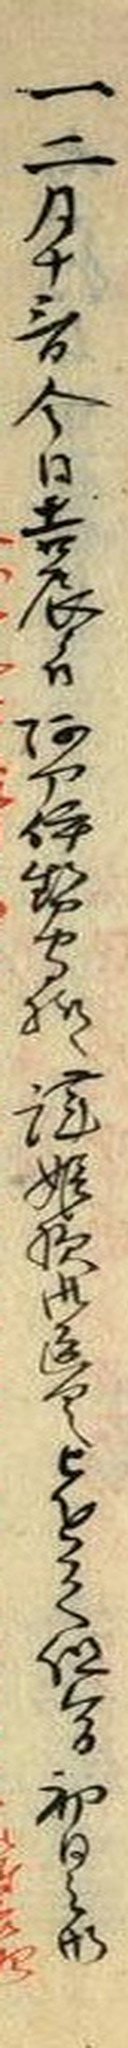一二月十三日今日吉辰ニ付阿部伊勢守様へ謹姫様御道具被進之但今日初日之御
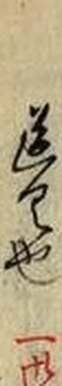道具也
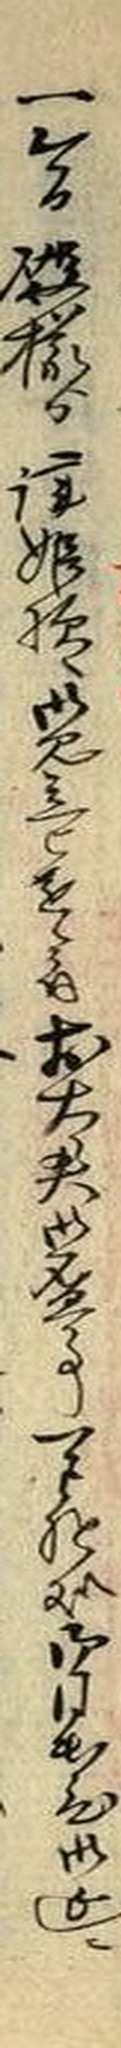一今日殿様ゟ謹姫様へ御見立被遊候ニ付於大奥御盃事可被遊候処御目出度御延ニ
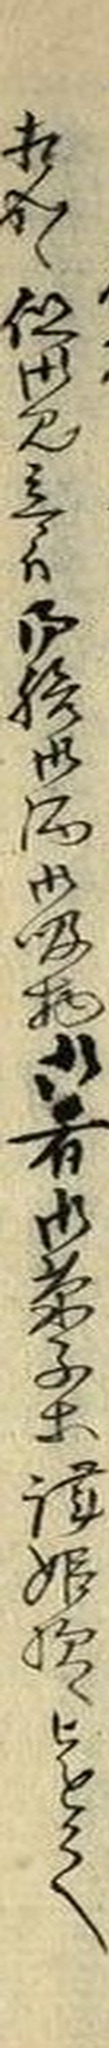相成候但御見立ニ付御膳御酒御吸物御肴御菓子等姫様へ被進之
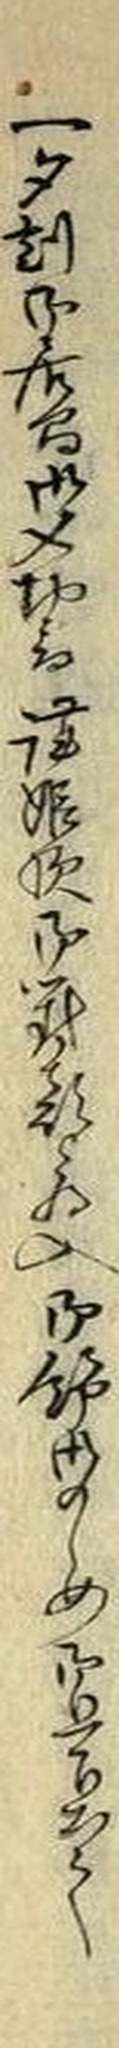一夕刻御居間御〆切ニ而謹姫様御対顔被為入御飾御のしめ御上下出之
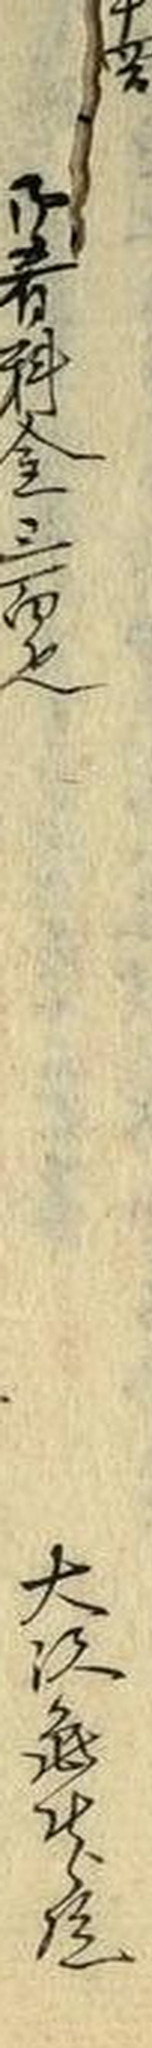御肴料金三百疋大沢亀次郎殿
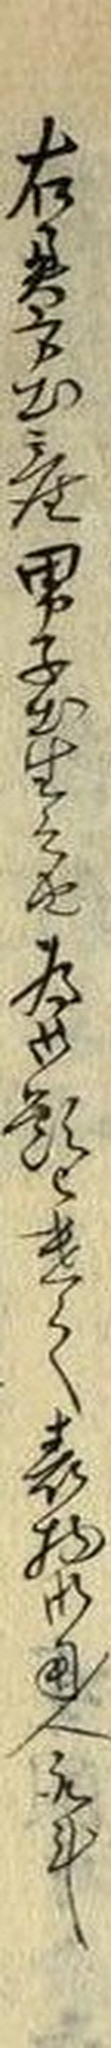右奥方出産男子出生之由為御歓被遣之表物御用人取斗
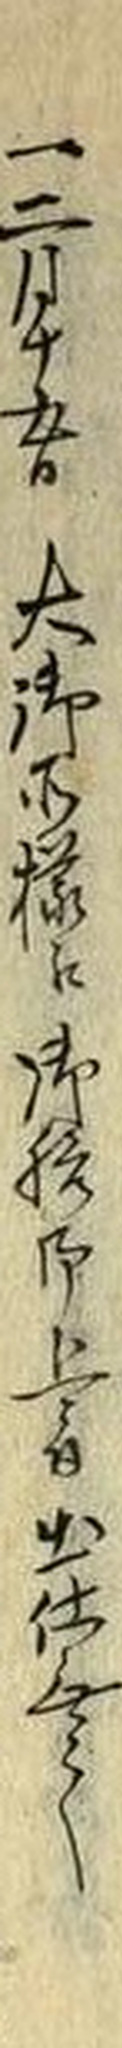一二月十五日大御所様江御膳御上ニ付出仕無之
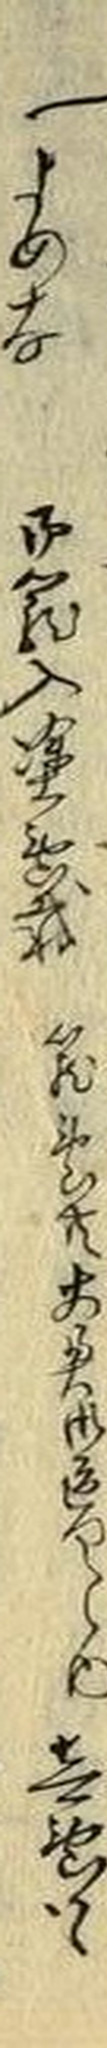よめな御籠入塗台載籠台共大奥御道具之内壱台ツヽ
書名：少傅日録抄（斉善付側向頭取日記、江戸并道中、初入在国、逝去後…
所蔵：福井県文書館 Fukui Prefectural Archives
